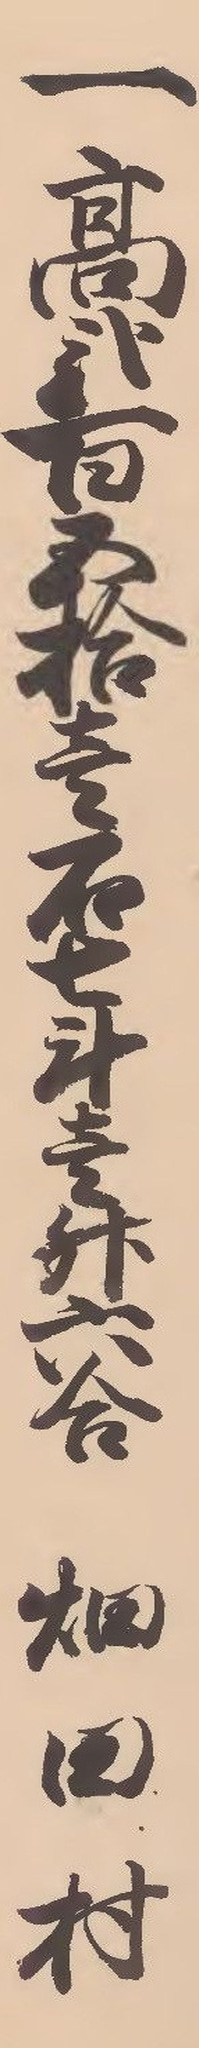一高弐百五拾壱石七斗壱升六谷畑田村
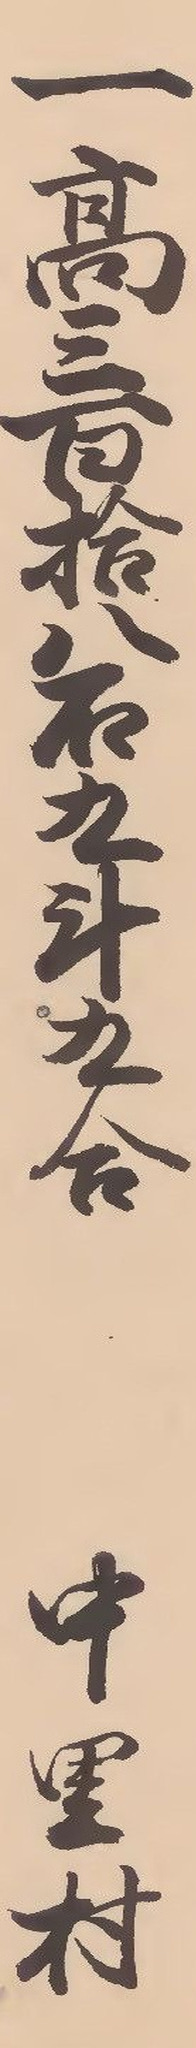一高三百拾八石九斗九合中里村
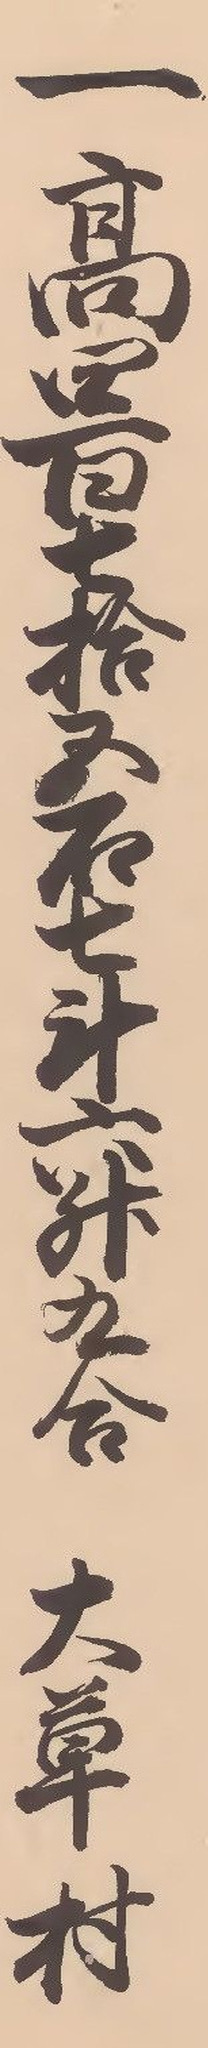一高四百七拾五石七斗六升九合大草村
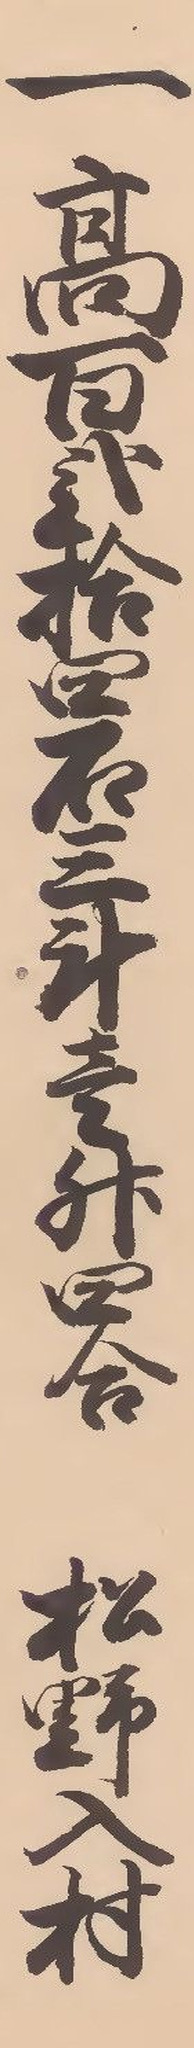一高百弐拾四石三斗壱升四合松野入村

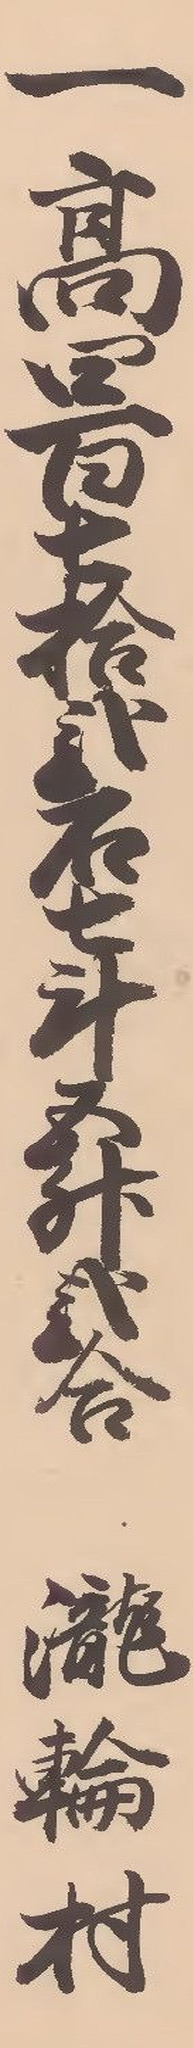一高四百七拾弐石七斗五升弐合滝輪村
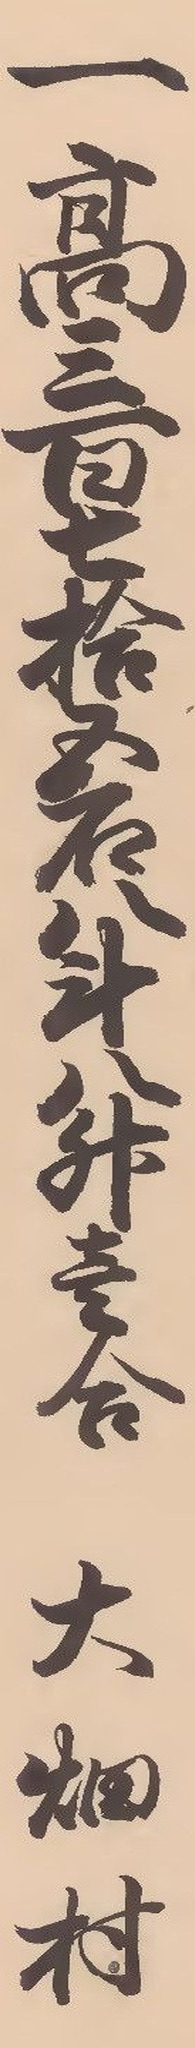一高三百七拾五石八斗八升壱合大畑村
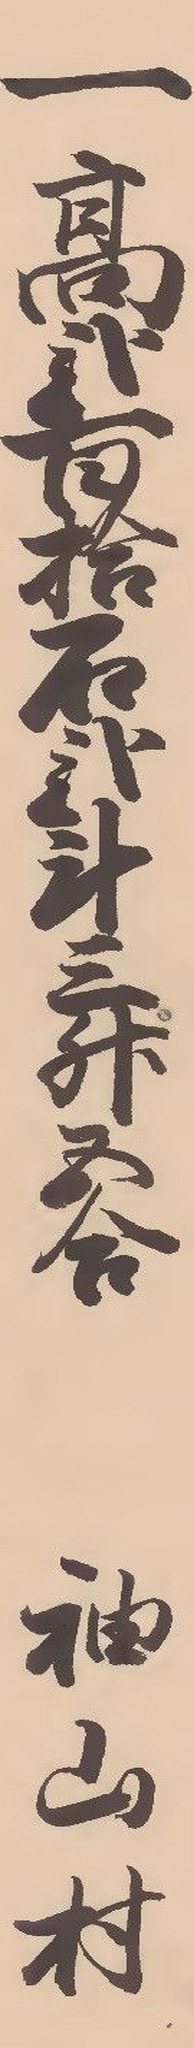一高弐百拾石弐斗三升五合袖山村
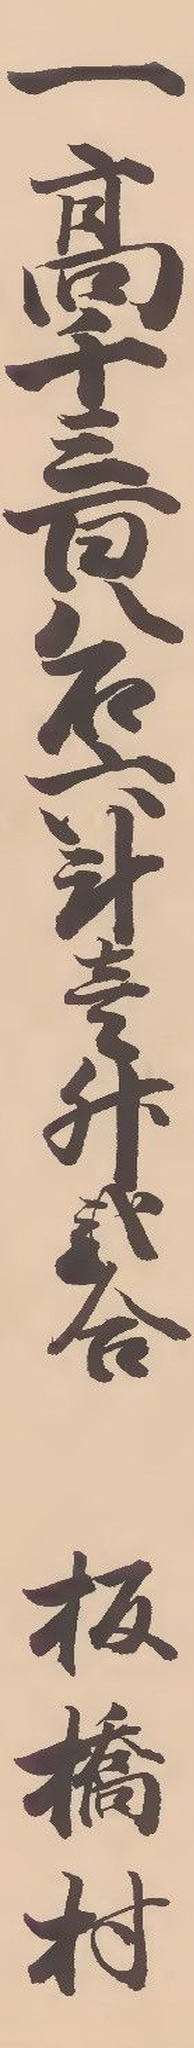一高千三百八石六斗壱升弐合板橋村
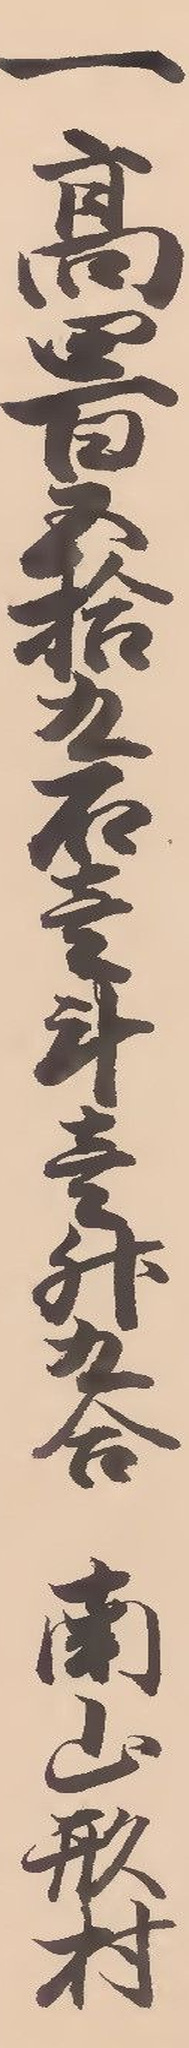一高四百五拾九石壱斗壱升九合南山形村
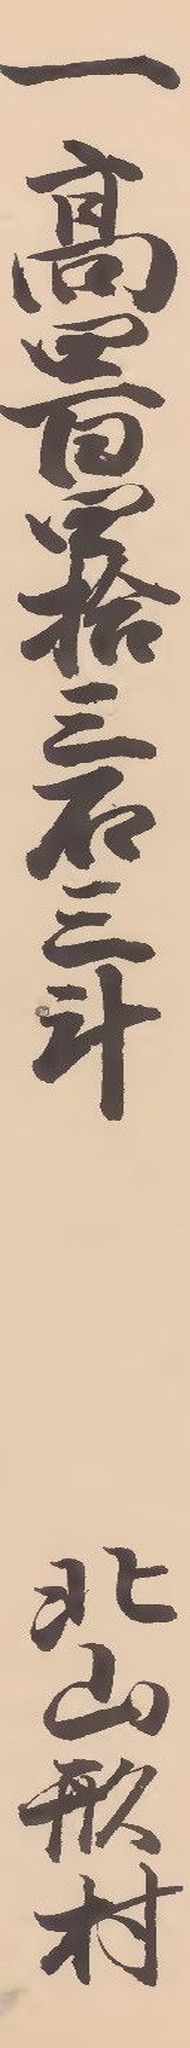一高四百四拾三石三斗北山形村
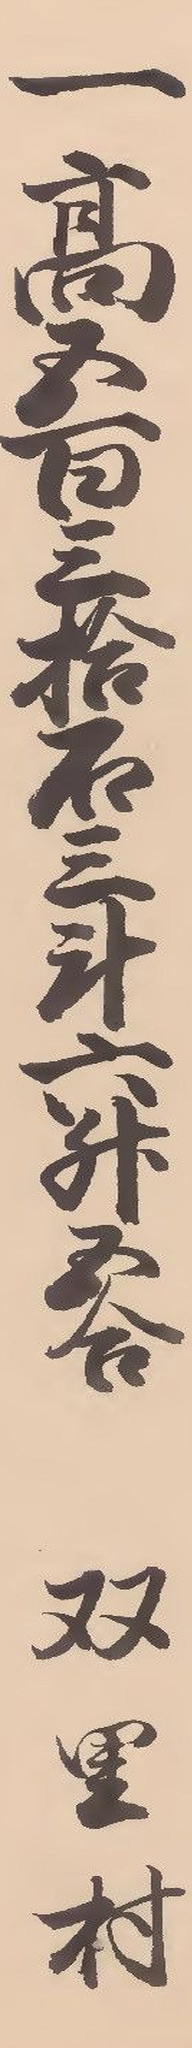一高五百三拾石三斗六升五合双里村
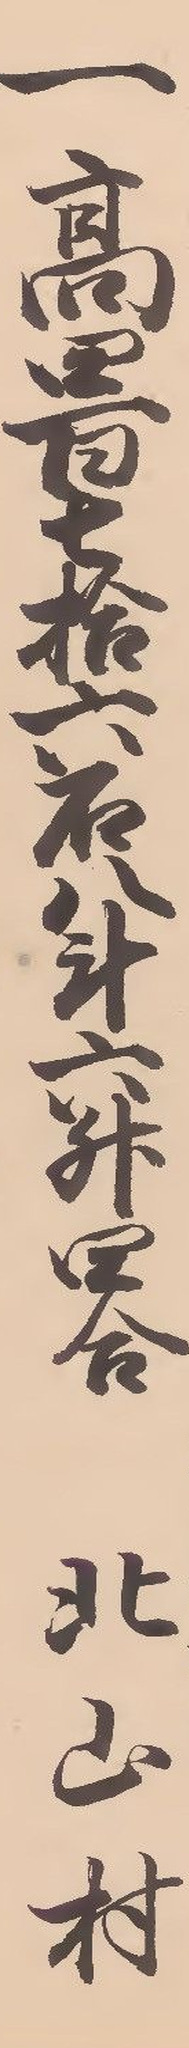一高四百七拾六石八斗六升四合北山村

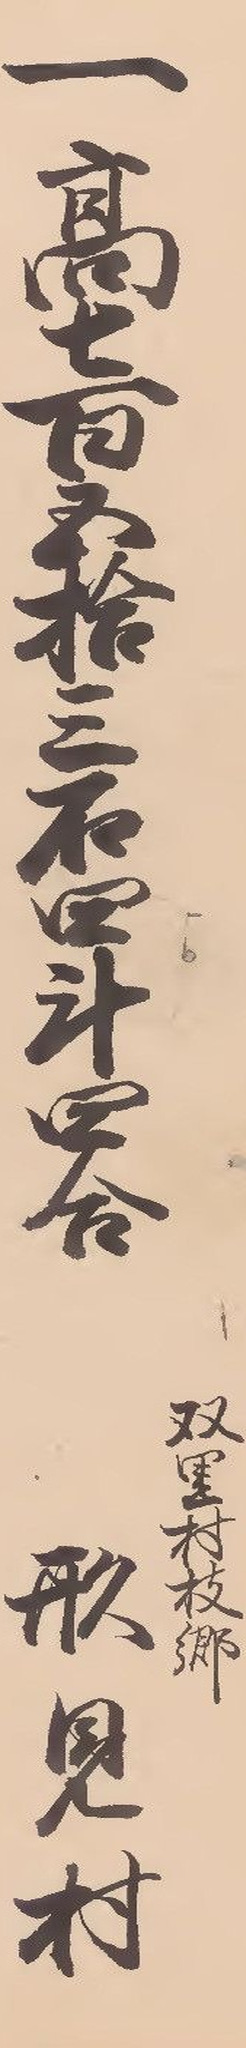一高七百五拾三石四斗四合形見村
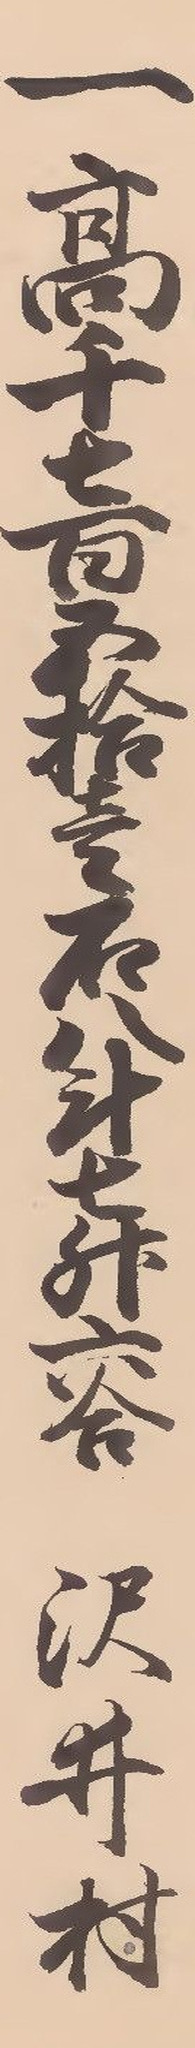一高千七百五拾壱石八斗七升六谷沢井村
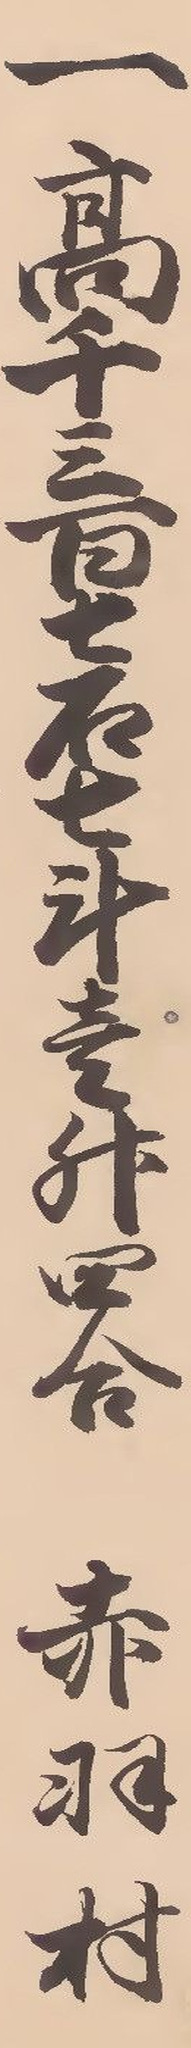一高千三百七石七斗壱升四合赤羽村
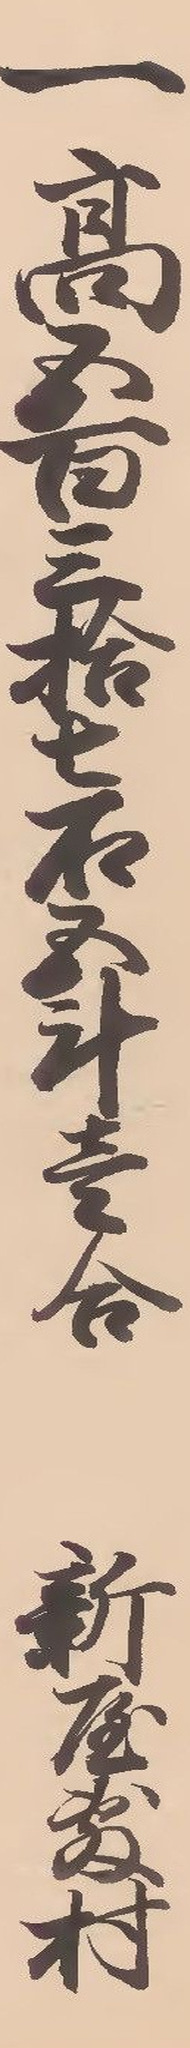一高五百三拾七石五斗壱合新屋敷村
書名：陸奥国郷帳　２
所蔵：国立公文書館 National Archives of Japan
